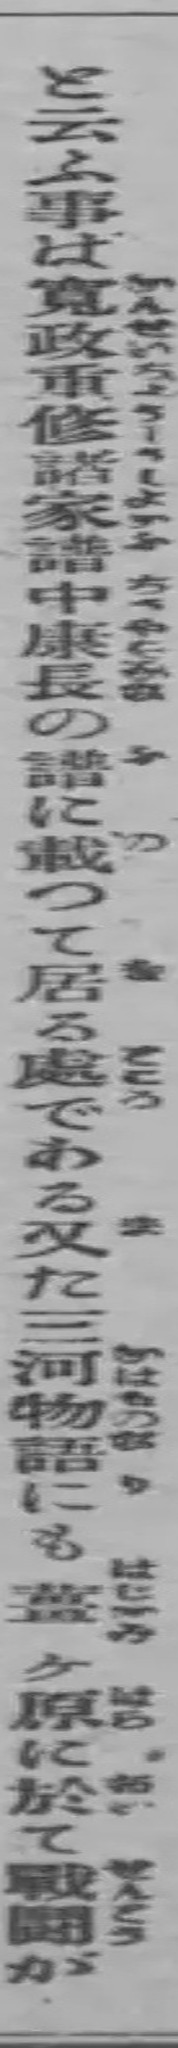と云ふ事は寛政重修諸家譜中康長の譜に載つて居る処である又た三河物語にもは薑ケ原に於て戦闘が
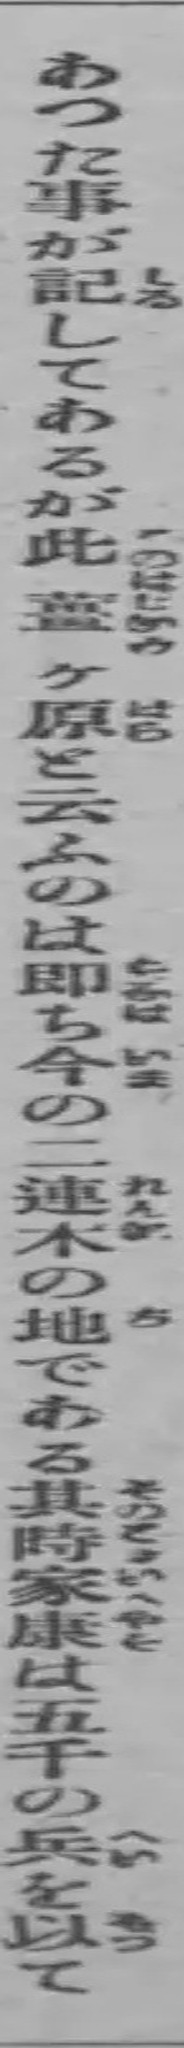あつた事が記してあるが此薑ケ原と云ふのは即ち今の二連木の地である其時家康は五千の兵を以て
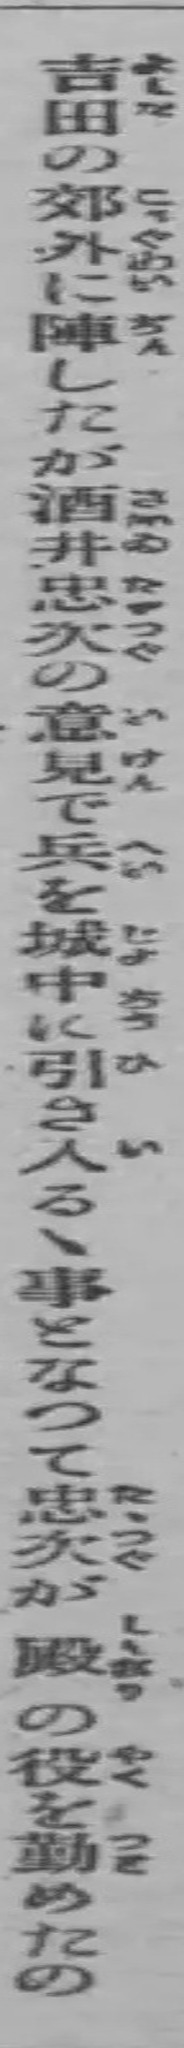吉田の郊外に陣したが酒井忠次の意見で兵を城中に引き入るゝ事となつて忠次が殿の役を勤めたの
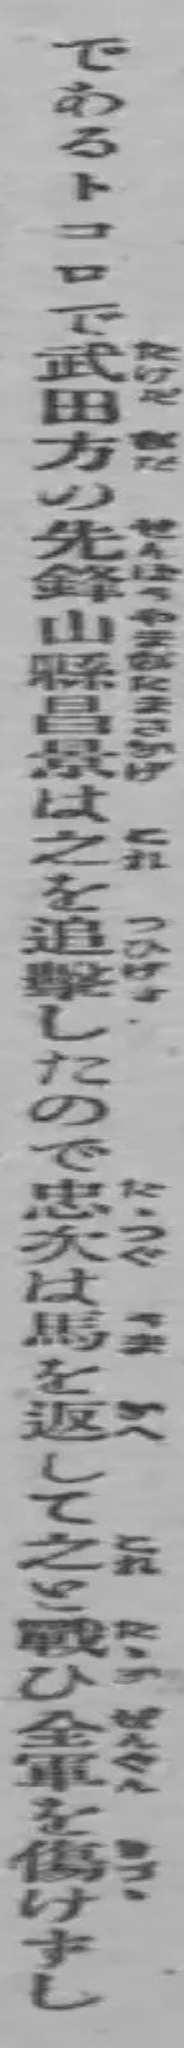であるトコロで武田方の先鋒山縣昌景は之を追撃したので忠次は馬を返して之と戦ひ全軍を傷けずし
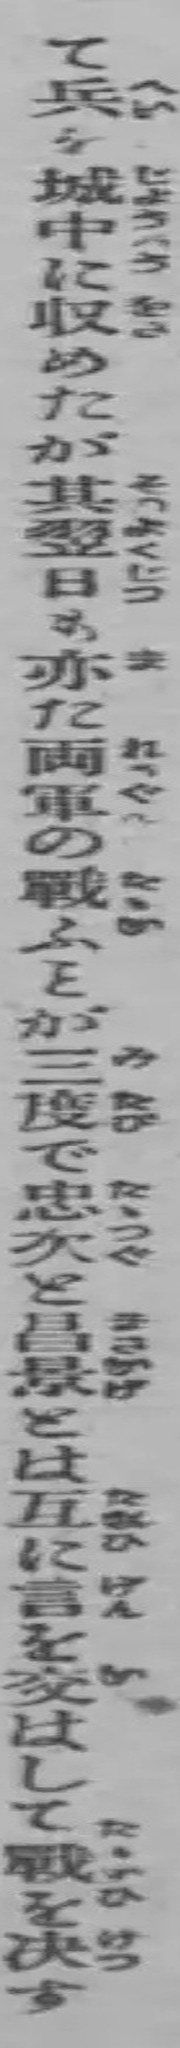て兵を城中に収めたが其翌日も亦た両軍の戦ふことが三度で忠次と昌景とは互に言を交はして戦を決す
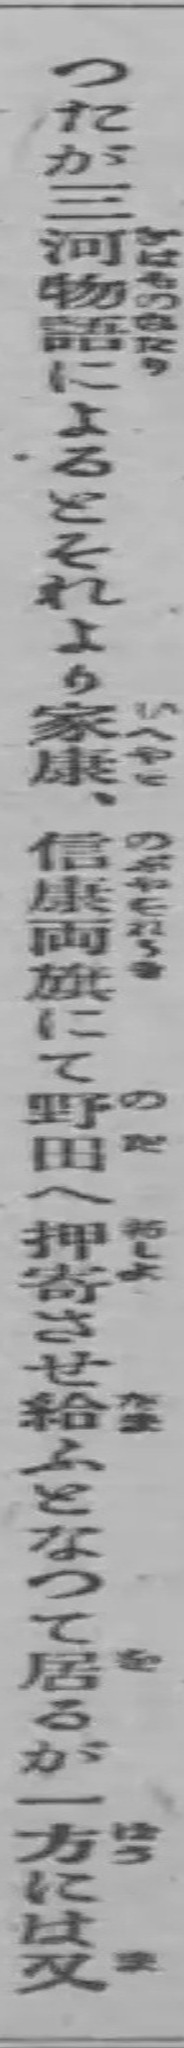むつたが三河物語によるとそれより家康、信康両旗にて野田へ押寄させ給ふとなつて居るが一方には又
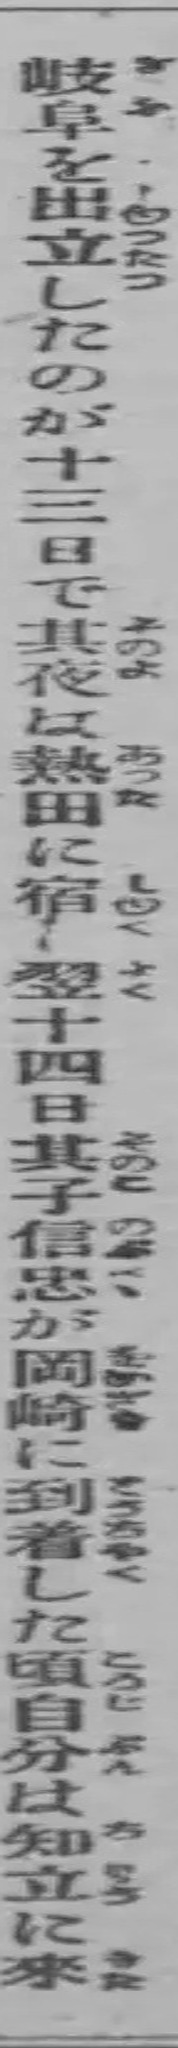岐阜を出立したのが十三日で其夜は熱田に宿し翌十四日其子信忠が岡崎に到着した頃自分は知立に来
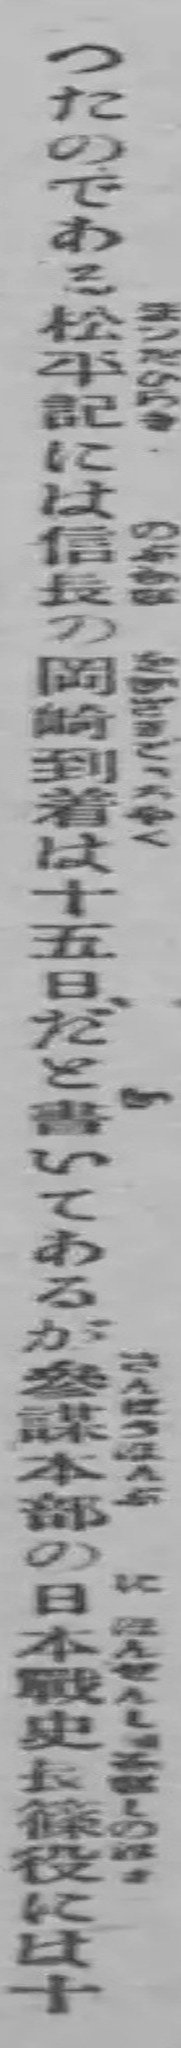つたのである松平記には信長の岡崎到着は十五日だと書いてあるが参謀本部の日本戦史長篠役に十
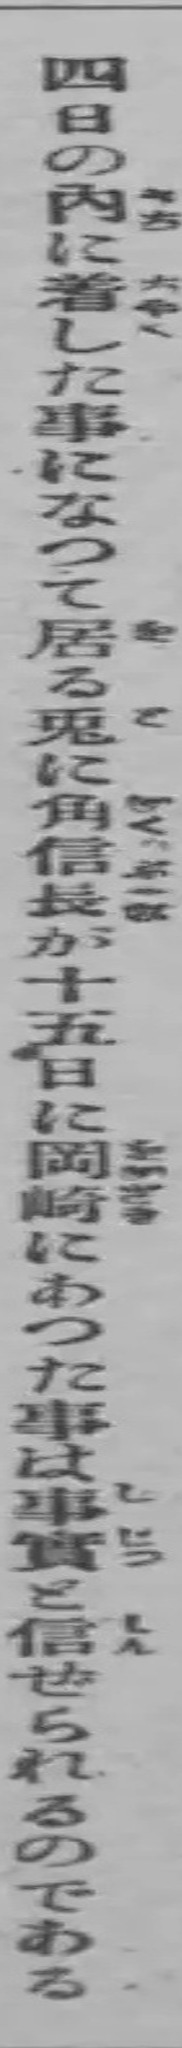四日の内に着した事になつて居る兎に角信長が十五日に岡崎にあつた事は事実と信ぜられるのである
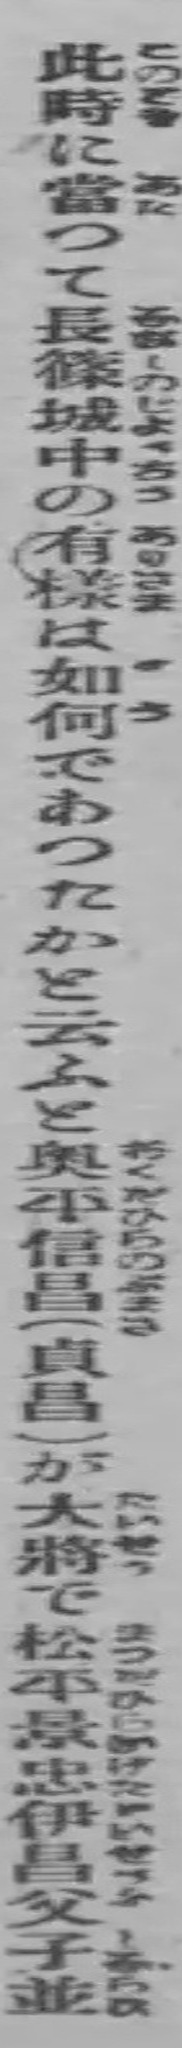此時に当つて長篠城中の有様は如何であつたかと云ふと奥平信昌(貞昌)が大将で松平景忠次伊昌父子並
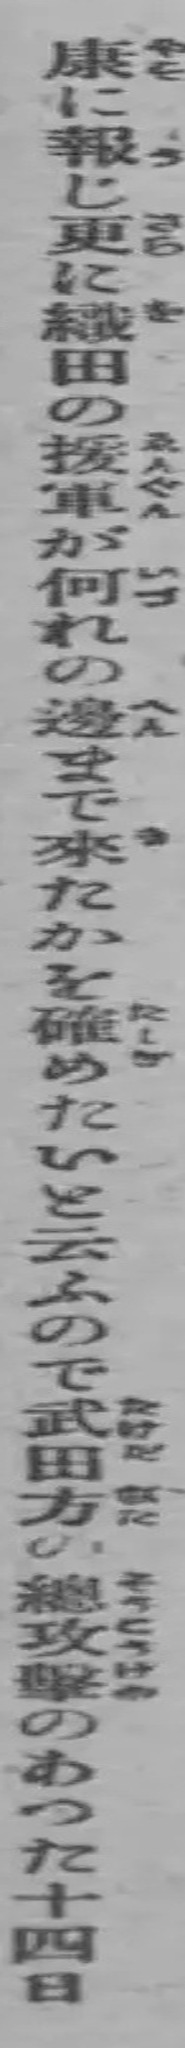康に報じ更に織田の援軍が何れの辺まで来たかを確めたいと云ふので武田方の総攻撃のあつた十四日

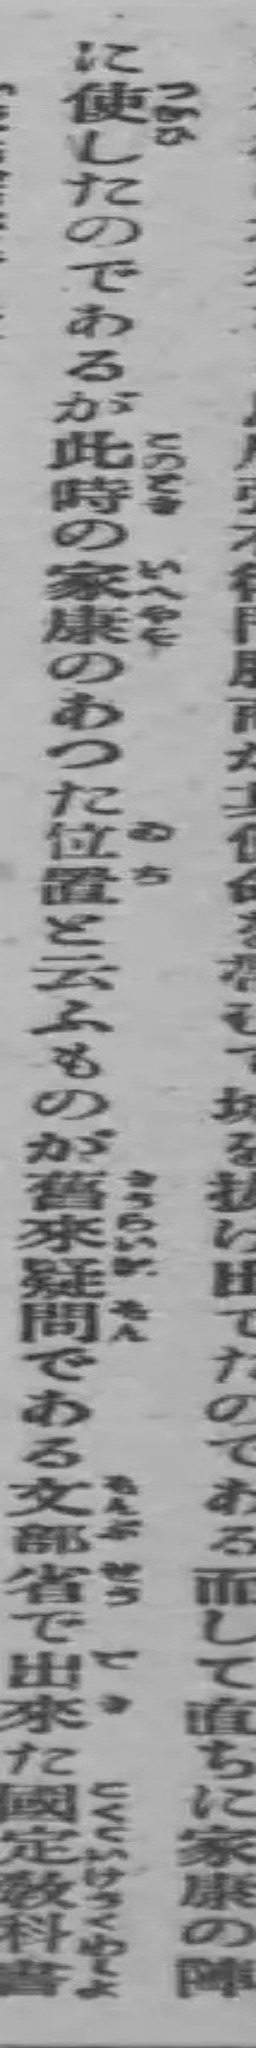に使したのであるが此時の家康のあつた位置と云ふものが旧来疑問である文部省で出来た国定教科書
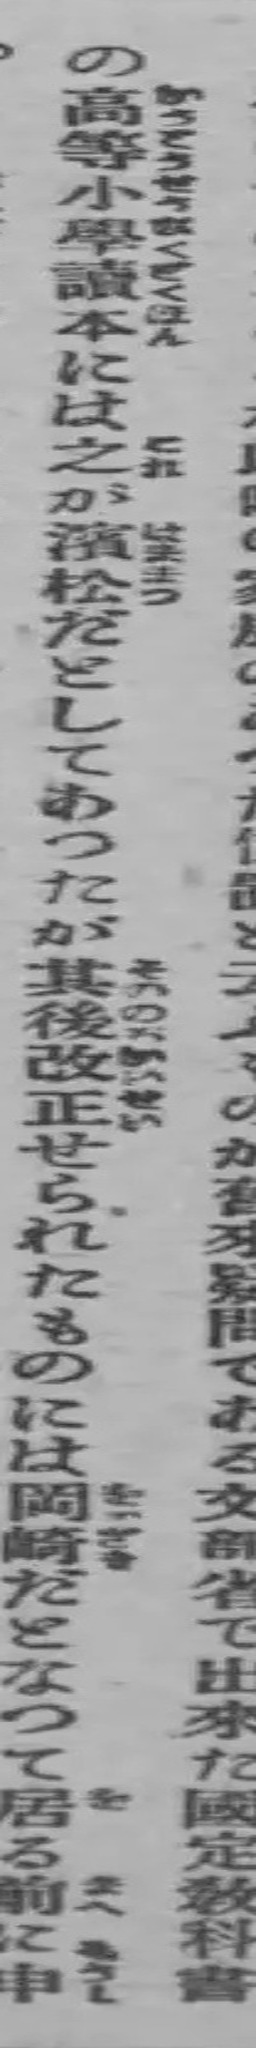の高等小学読本には之が浜松だとしてあつたが其後改正せられたものには岡崎だとなつて居る前に申
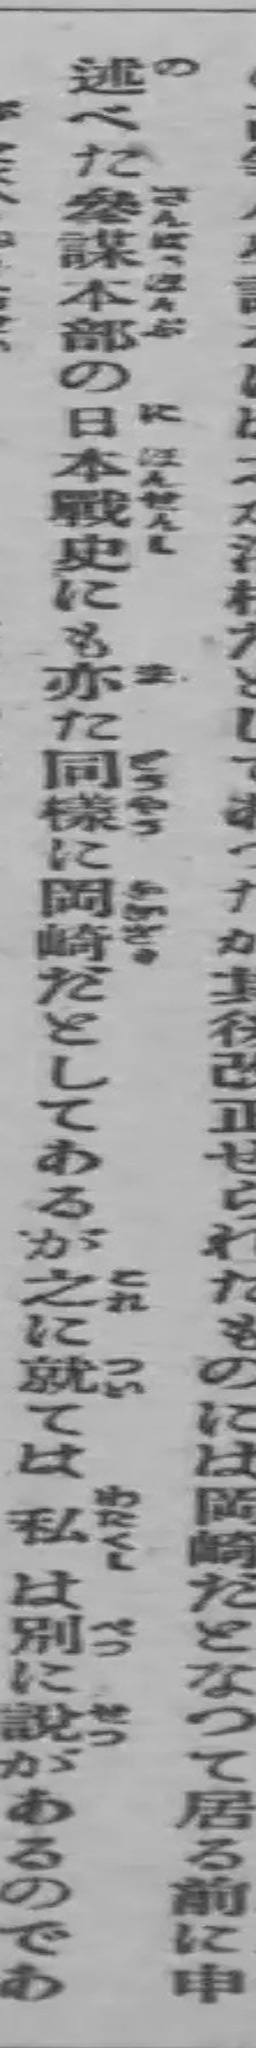述べた参謀本部の日本戦史にも亦た同様に岡崎だとしてあるが之に就ては私は別に説があるのであ
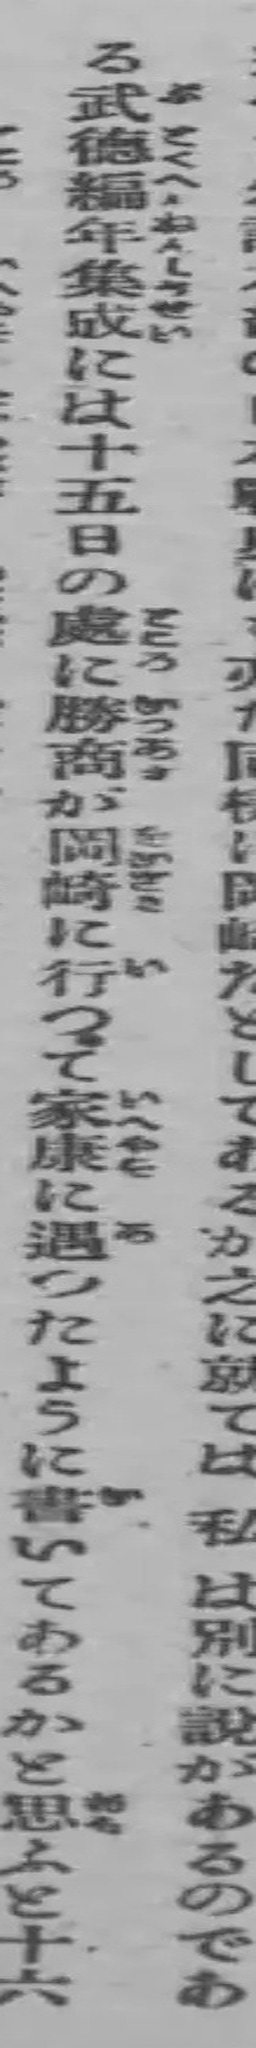る武徳編年集成には十五日の処に勝商が岡崎に行つて家康に遇つたように書いてあるかと思ふと十六
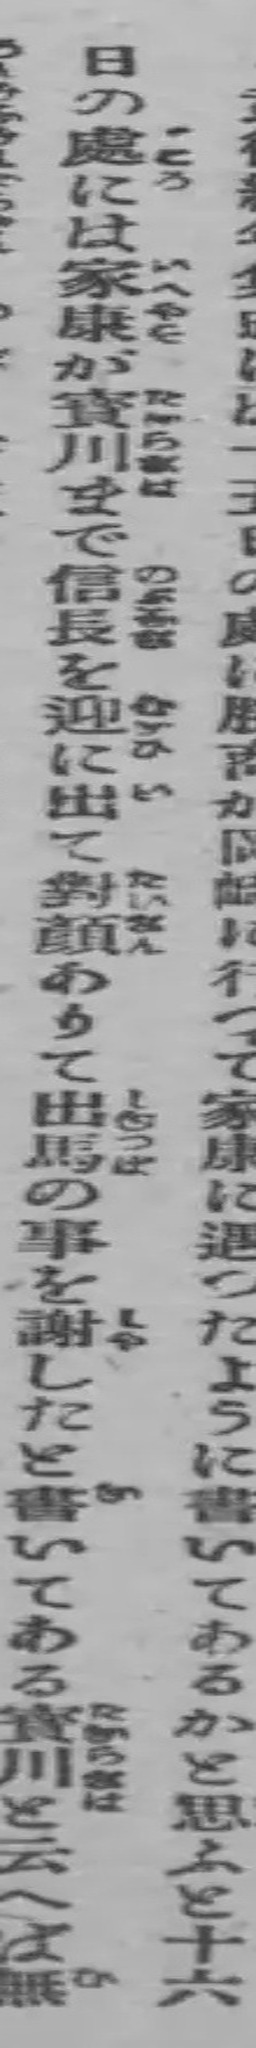日の処には家康が宝川まで信長を迎に出て対顔ありて出馬の事を謝したと書いてある宝川と云へば無
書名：豊橋市史談
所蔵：国立国会図書館 National Diet Library, JAPAN
